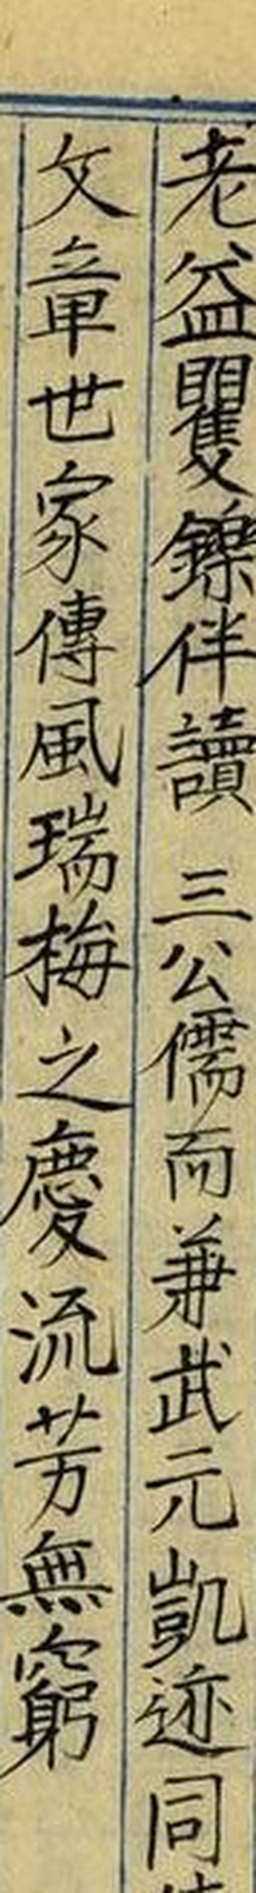文章世家傳風瑞梅之慶流芳無窮
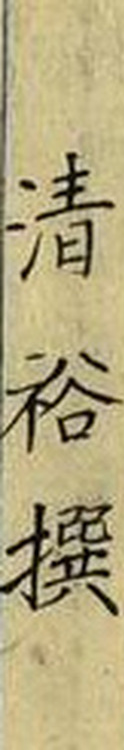清裕撰
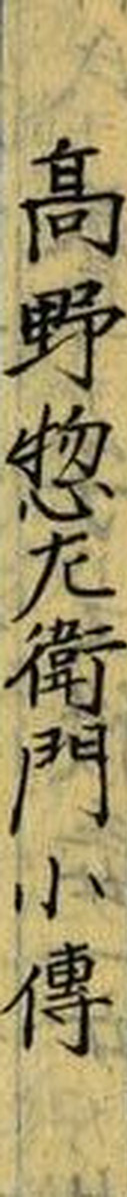髙野惣左衛門小傳
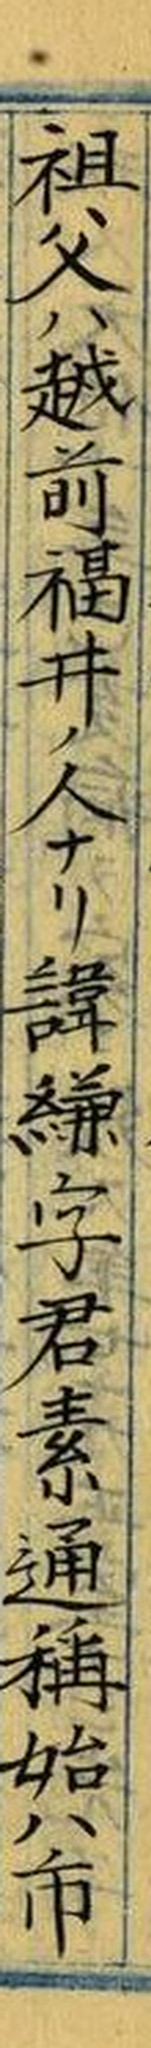祖父ハ越前福井ノ人ナリ諱縑字君素通稱始ハ市
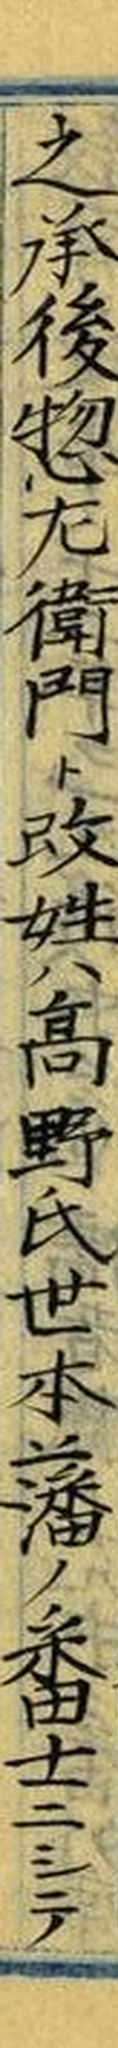之承後惣左衛門ト改姓ハ髙野氏世本藩ノ番士ニシテ
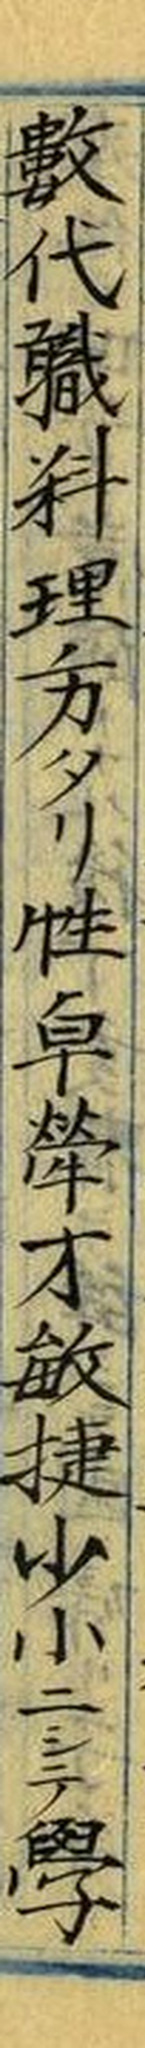數代職料理方タリ性卓犖才敏捷少小ニシテ學
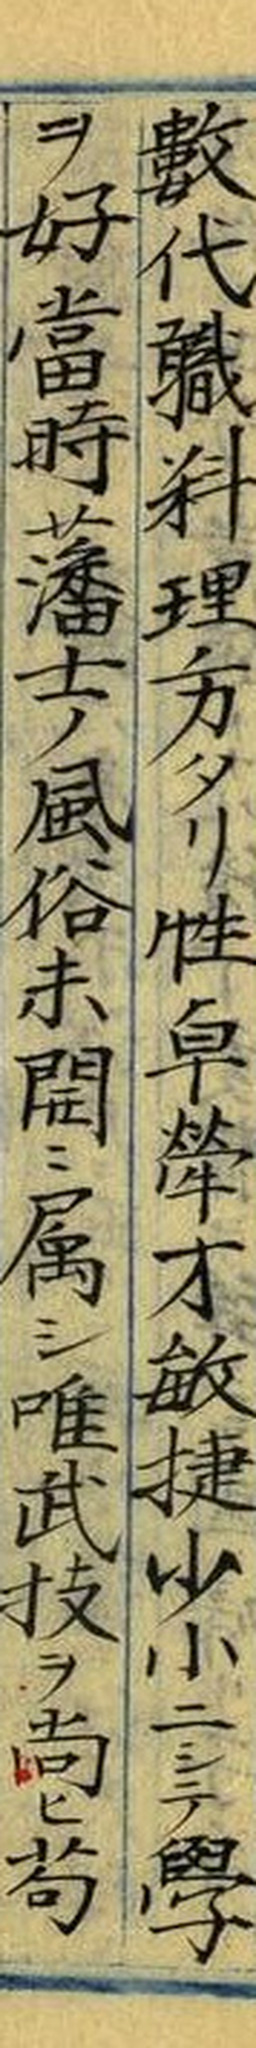ヲ好當時藩士ノ風俗未開ニ属シ唯武技ヲ尚ヒ苟
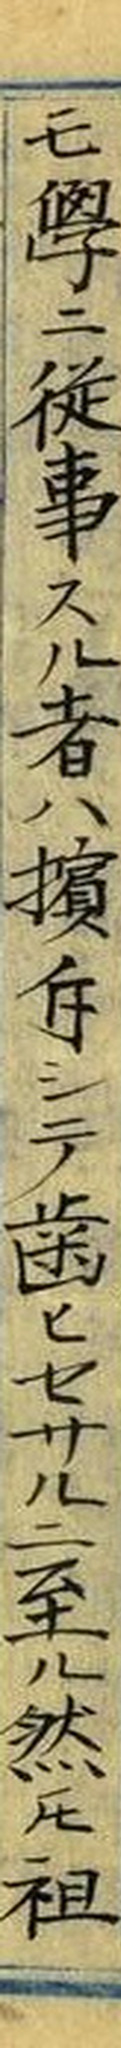モ學ニ従事スル者ハ擯斥シテ歯ヒセサルニ至ル然トモ祖
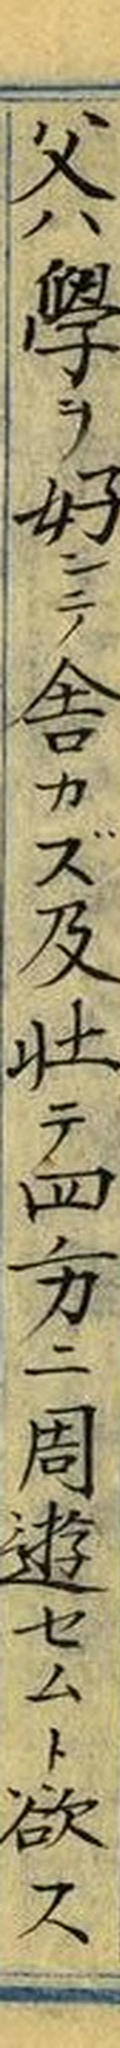父ハ學ヲ好ンテ舎カズ及壮テ四方ニ周遊セムト欲ス
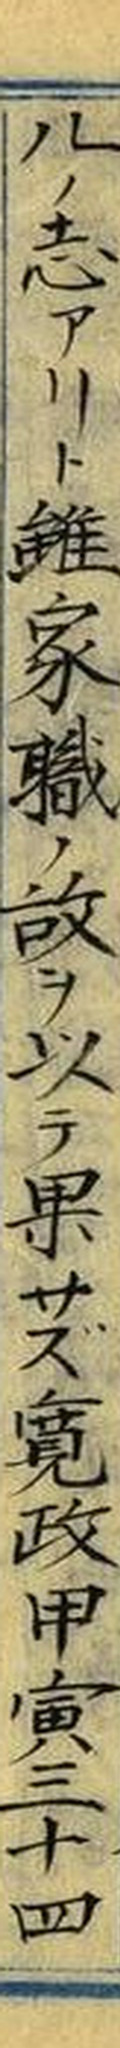ルノ志アリト雖家職ノ故ヲ以テ果サズ寛政甲寅三十四
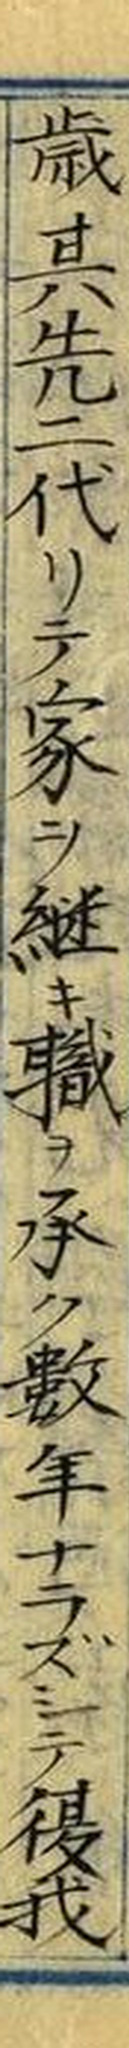歳其先ニ代リテ家ヲ継キ職ヲ承ク數年ナラズシテ復我
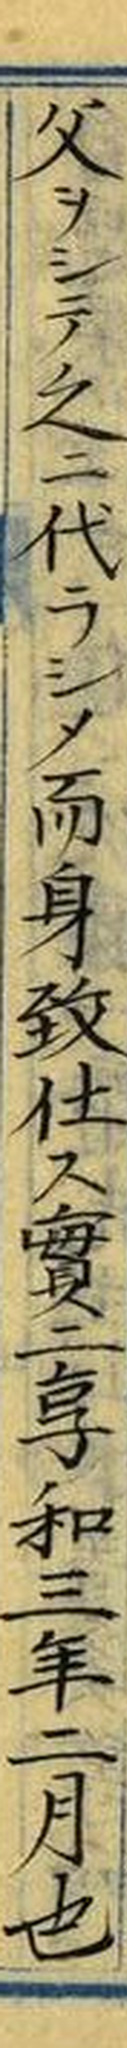父ヲシテ之ニ代ラシメ而身致仕ス實ニ享和三年二月也

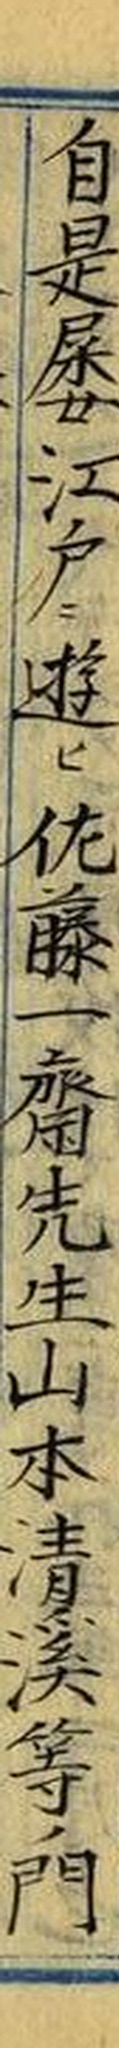自是屡江戸ニ遊ヒ佐藤一齋先生山本清溪等ノ門
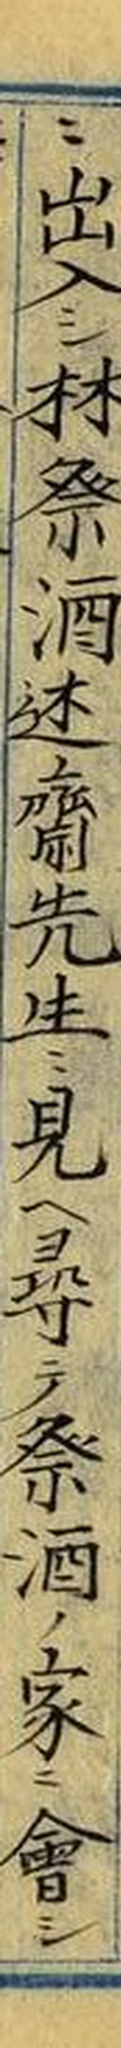ニ出入シ林祭酒述齋先生ニ見ヘ尋テ祭酒ノ家ニ會シ
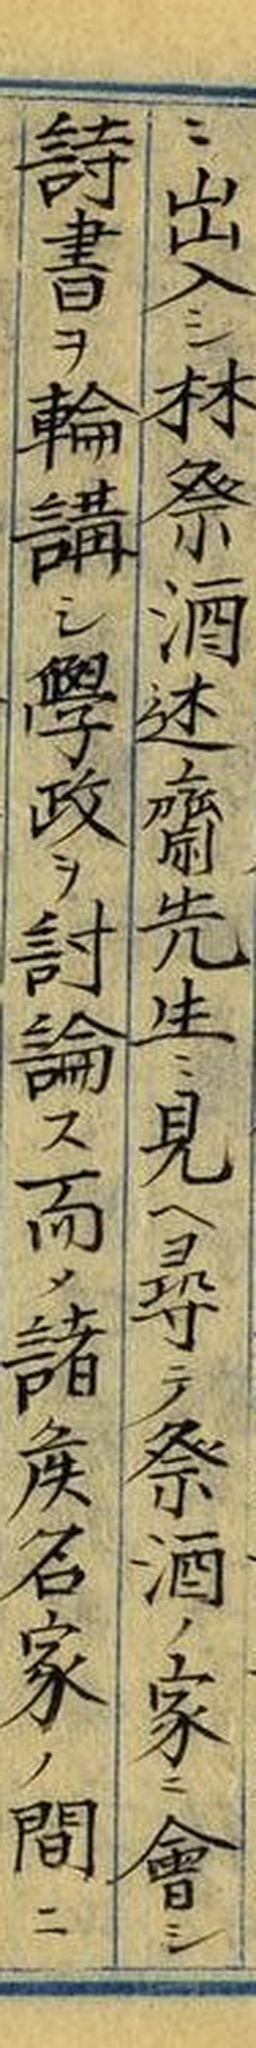詩書ヲ輪講シ學政ヲ討論ス而シテ諸矦名家ノ間ニ
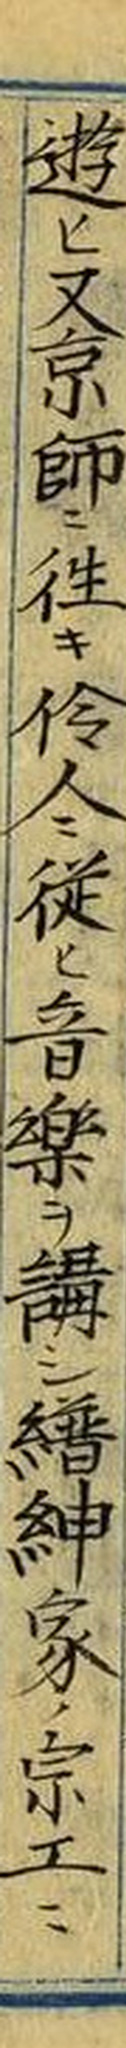遊ヒ又京師ニ往キ伶人ニ従ヒ音樂ヲ講シ紳家ノ宗工ニ
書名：温古集 四巻
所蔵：福井県文書館 Fukui Prefectural Archives
